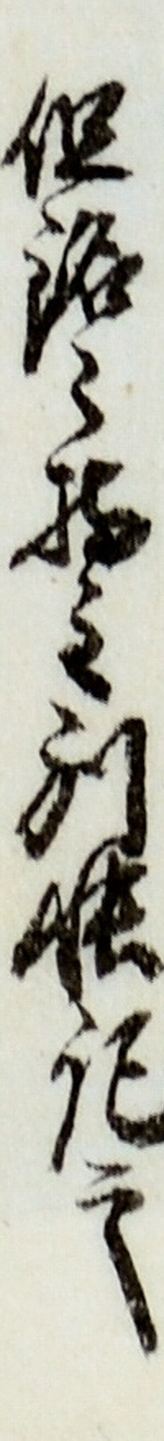但銘々持主別帳記之
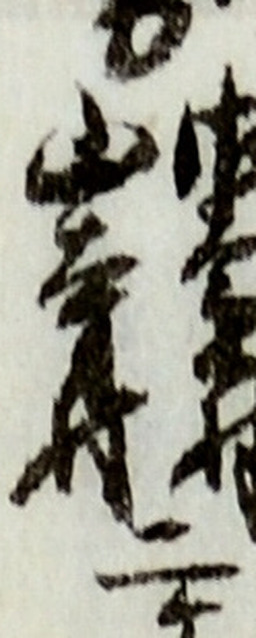山寺村
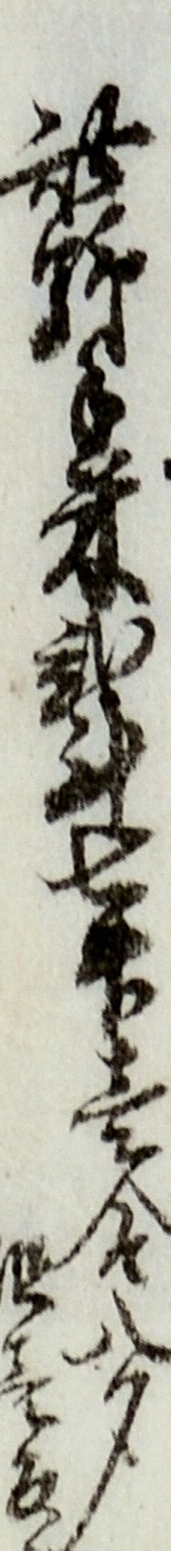此野手米弐斗七升壱合八勺
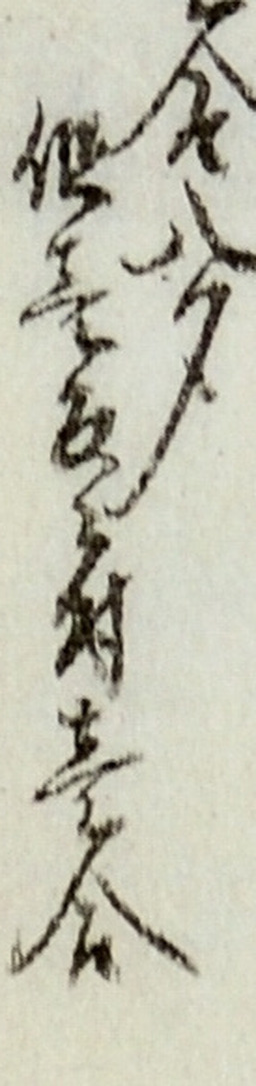但壱反ニ付壱合
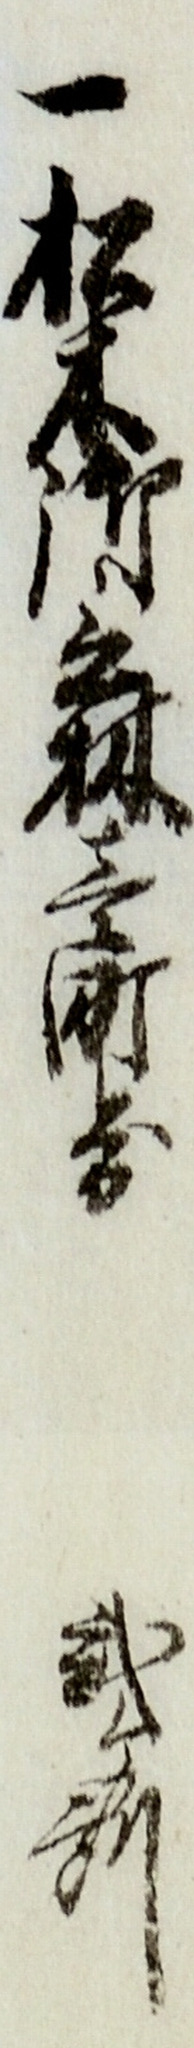一松木御立林壱町歩弐ヶ所
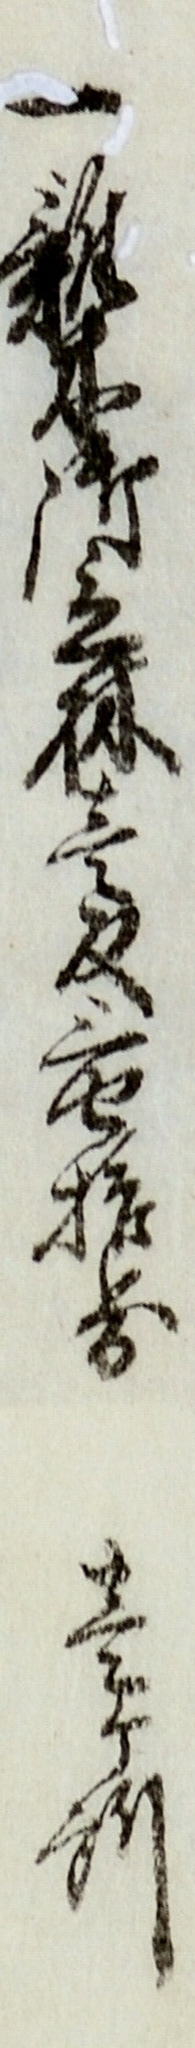一雑木御立林壱反三セ拾歩壱ヶ所
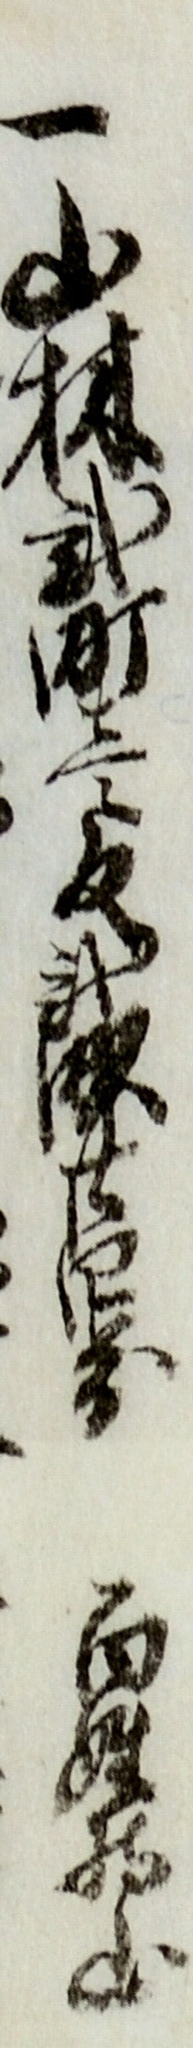一山林弐町壱反弐畝廿四歩百姓持山
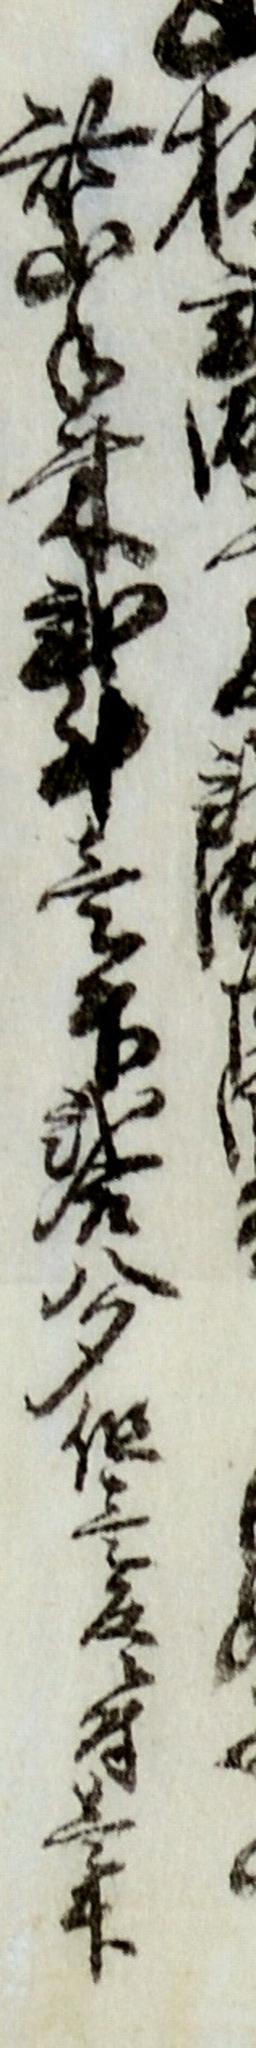此山手米弐斗壱升弐合八勺但壱反ニ付壱升
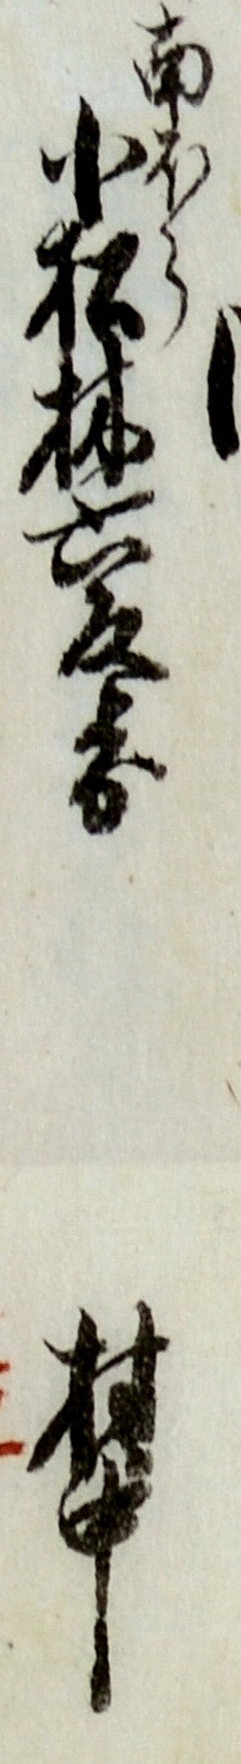小松林六反歩村中

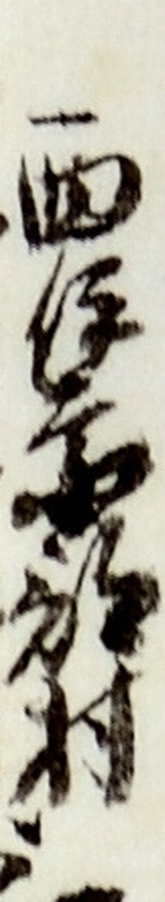西伊那部村
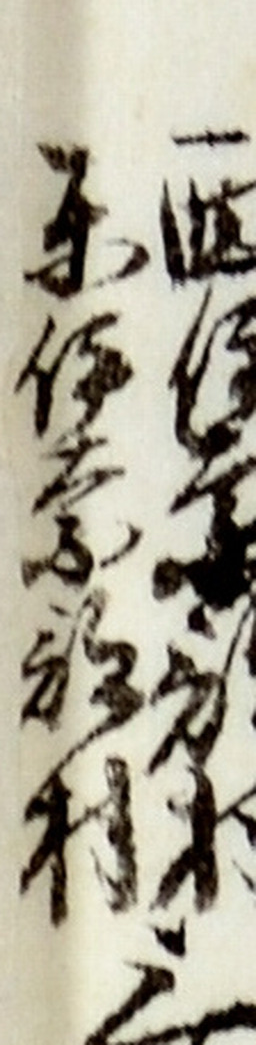西伊那部村
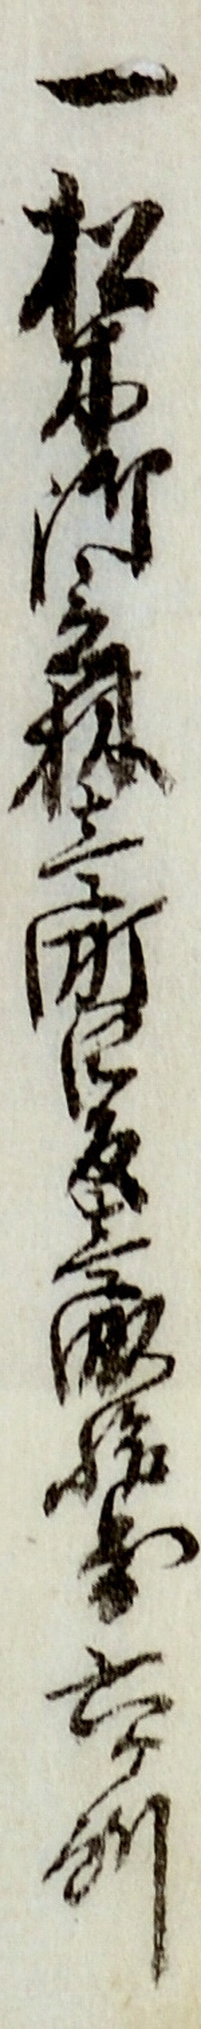一松木御立林壱町四反壱畝拾歩六ヶ所
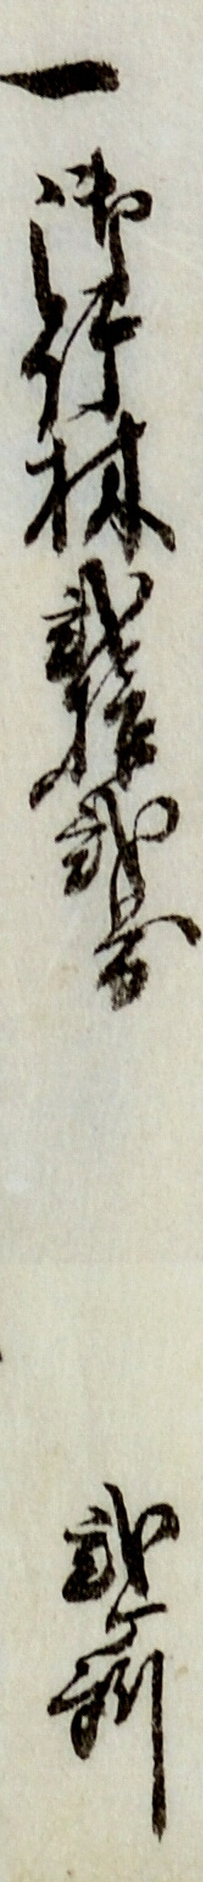一御竹林弐拾弐歩弐ヶ所
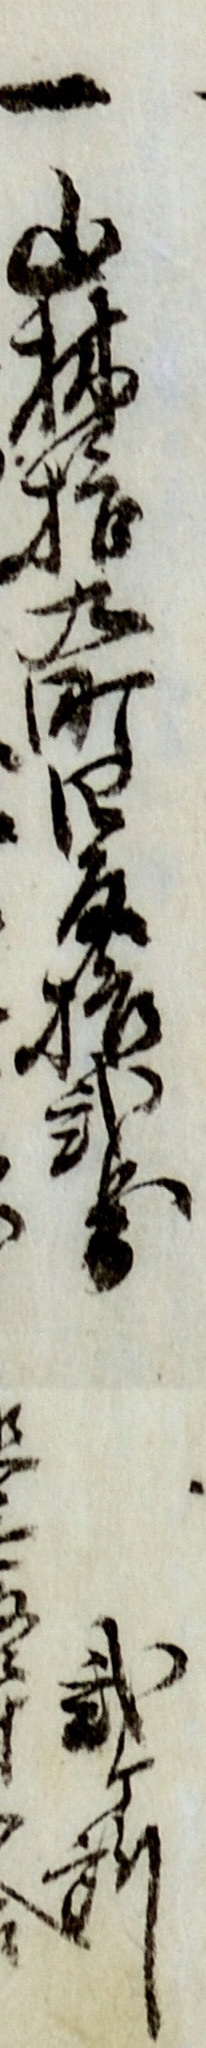一山林拾九町四反拾弐歩弐ヶ所
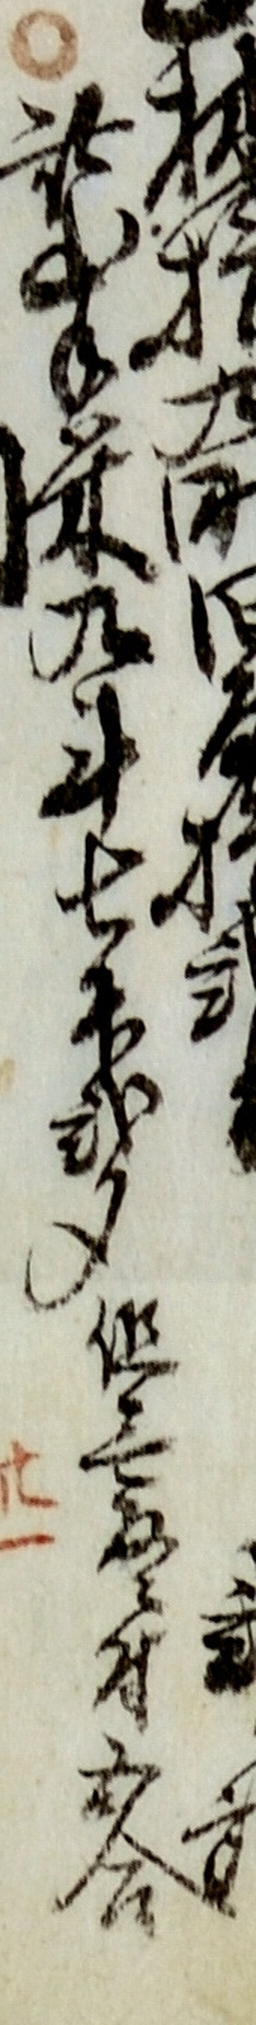○此山手米九斗七升弐勺但壱反ニ付五合

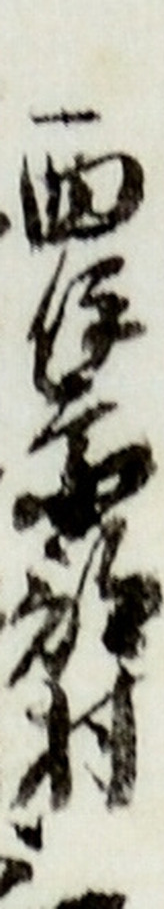西伊那部村
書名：御領分中山林社地手控
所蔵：伊那市立高遠町図書館・合同会社AMANE
